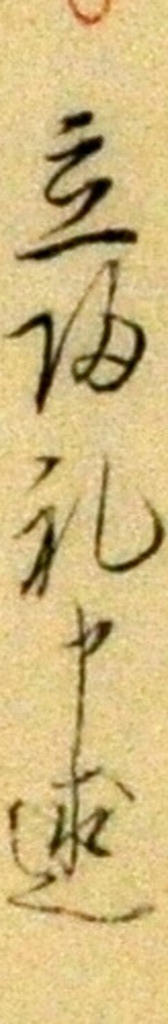立帰礼申述
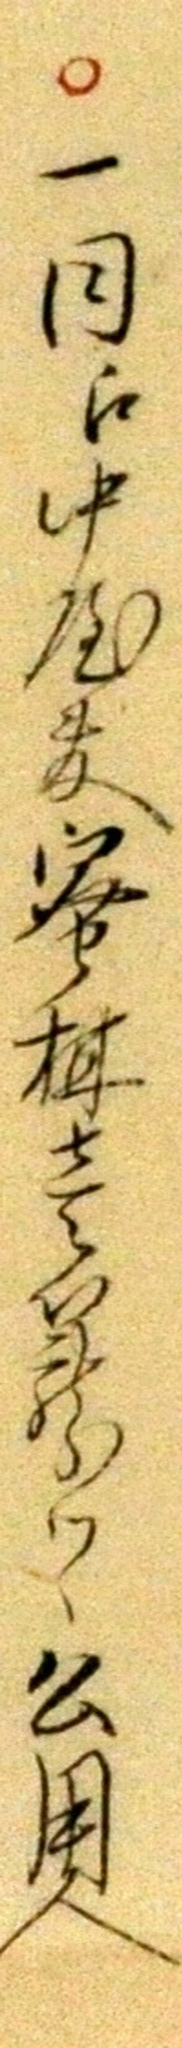一同え中屋敷蜜柑壱籠ツヽ公用人
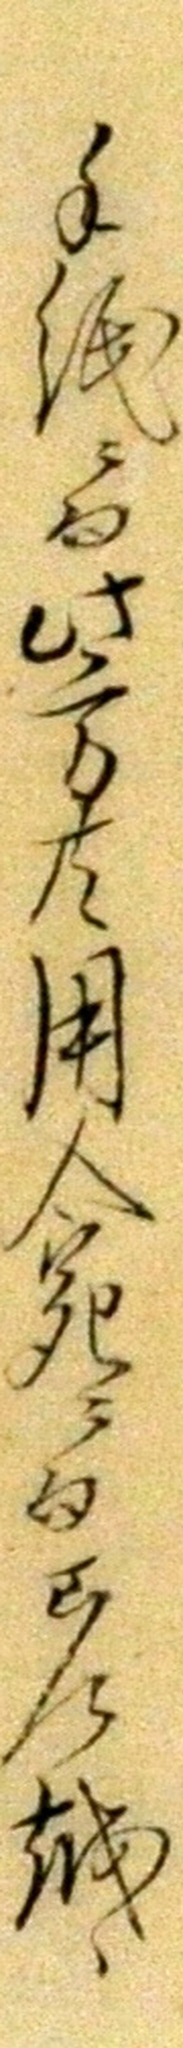手紙二而此方共用人宛ニ而差越候
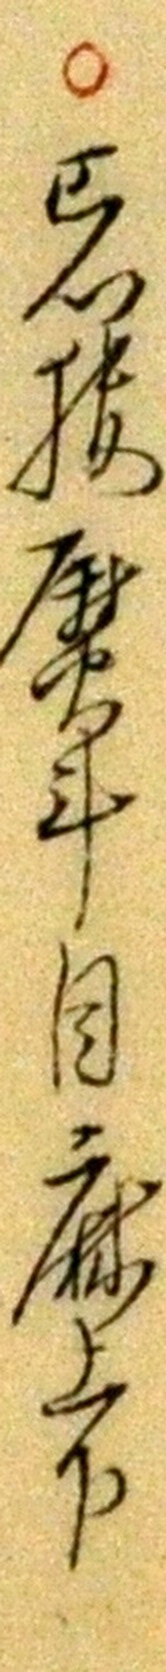着服熨斗目麻上下
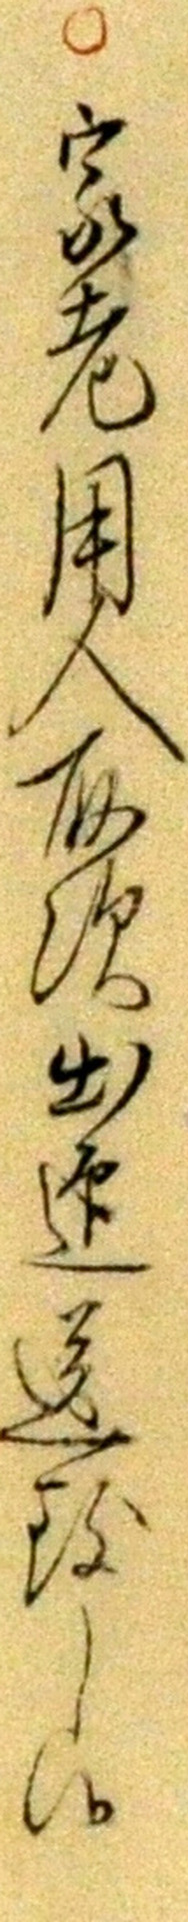家老用人取次出迎送致し候
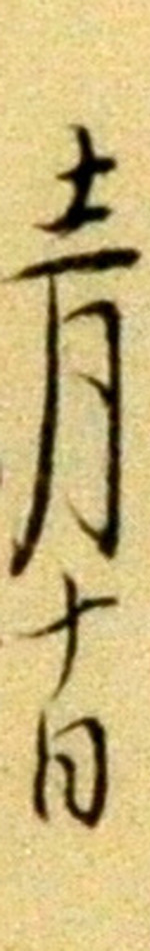十二月十日
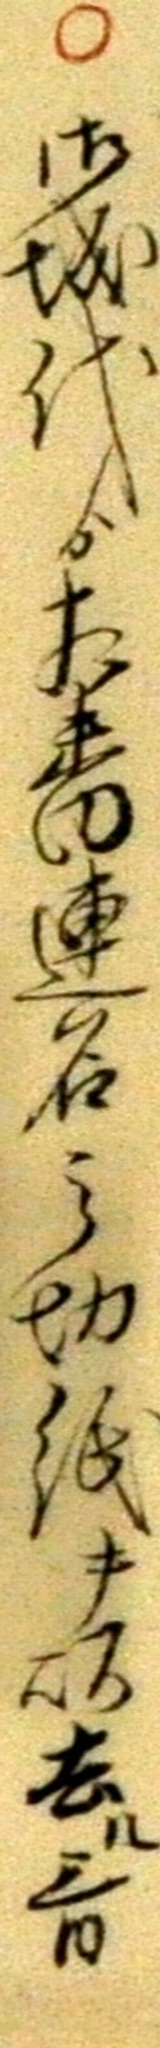御城代ゟ相番連名之切紙ヲ以去ㇽ三日
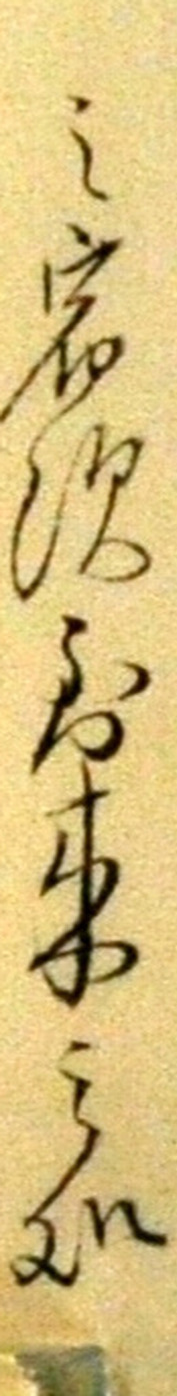之宿次到来之処

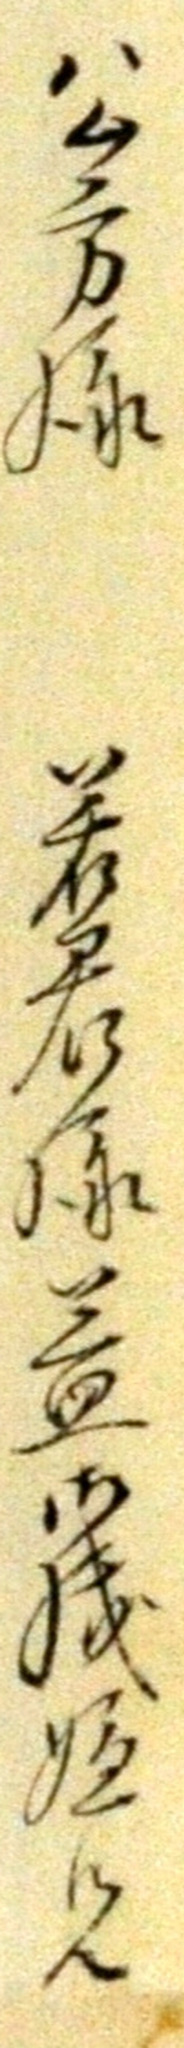公方様若君様益御機嫌克
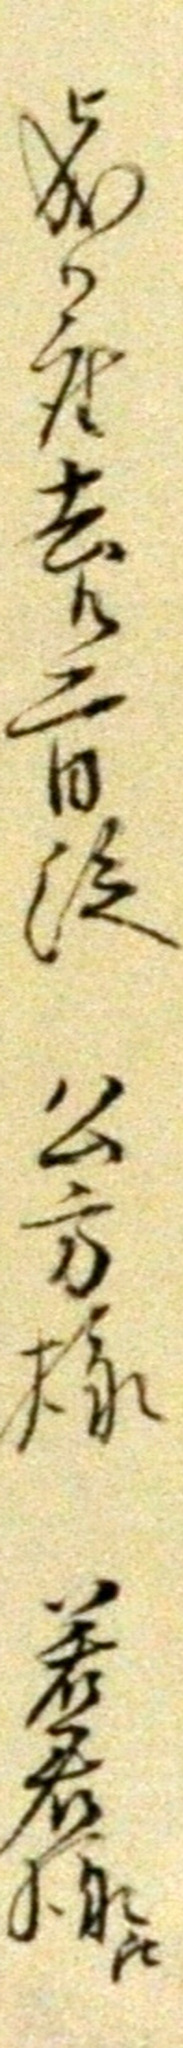被成御座去ル二日従公方様若君様え
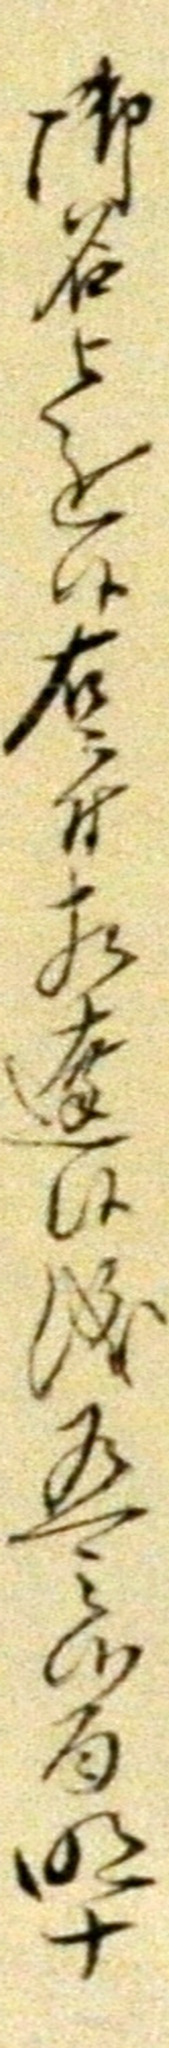御名被進候右二付相達候儀有之候間明十
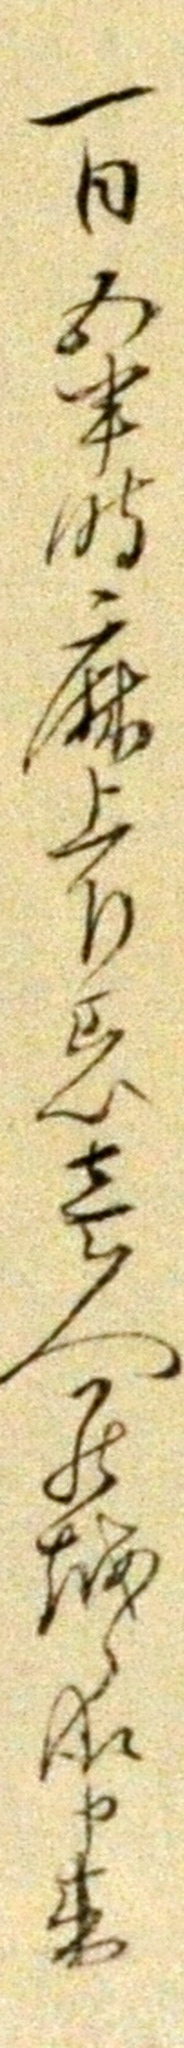一日五半時麻上下着壱人罷越候様申来
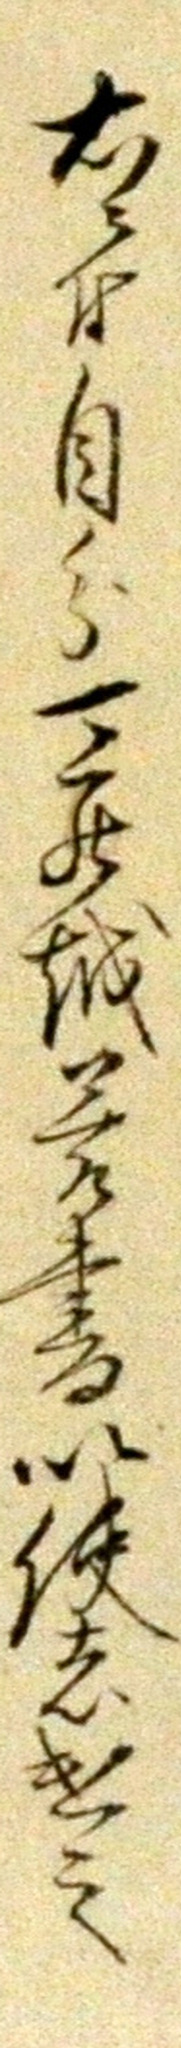右二付自分可罷越答書以使者遣之
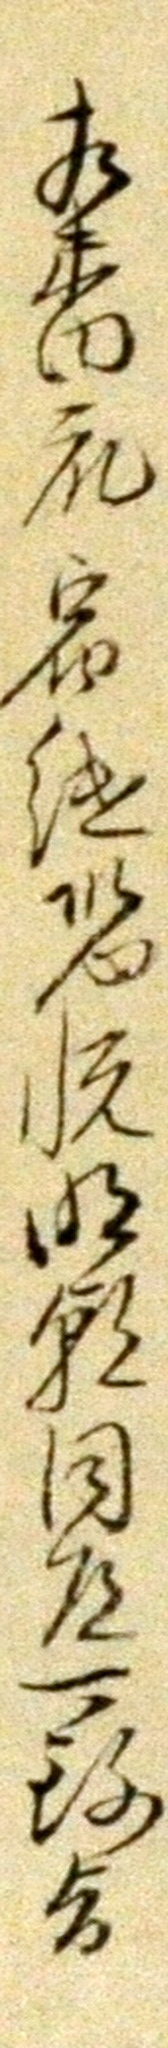相番衆宿継恐悦明朝同道可致旨
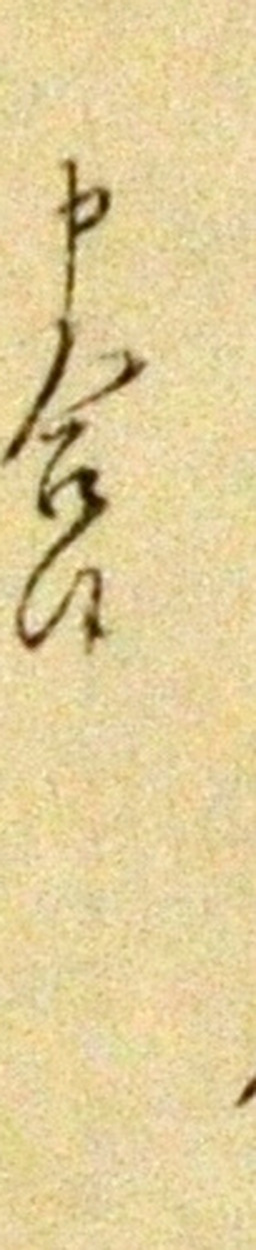申合候
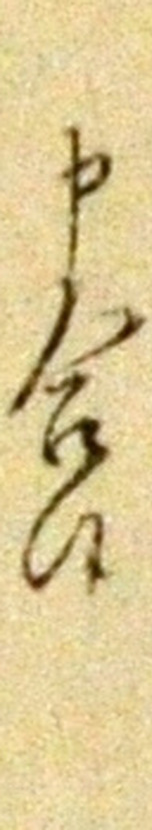申合候
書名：大阪加番関係諸書留〔一括〕
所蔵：伊那市立高遠町図書館・合同会社AMANE
